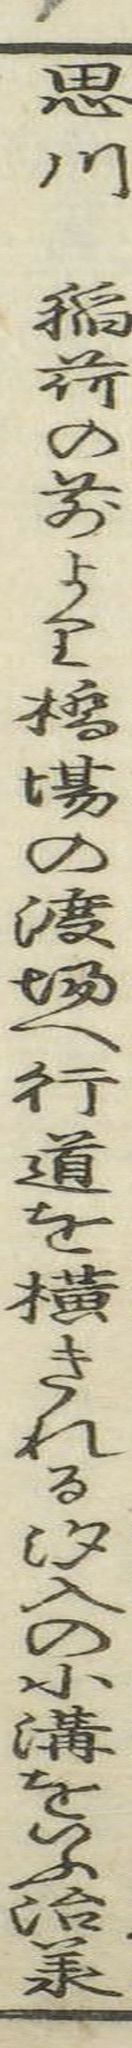思川稲荷の前より橋場の渡場へ行道を横きれる汐入の小溝をいふ治承
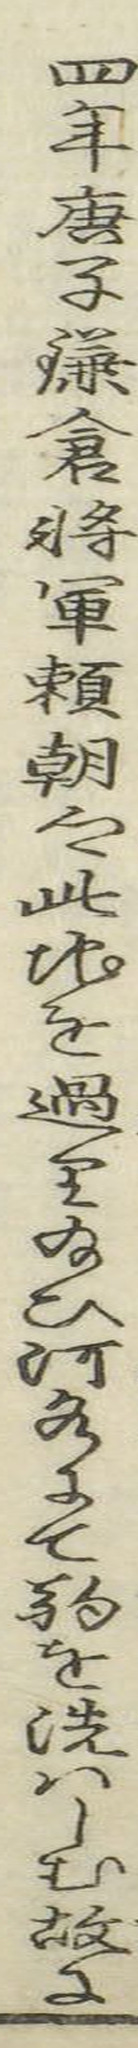四年庚子鎌倉将軍頼朝卿此地を過り給ひ河水にて駒を洗はしむ故に
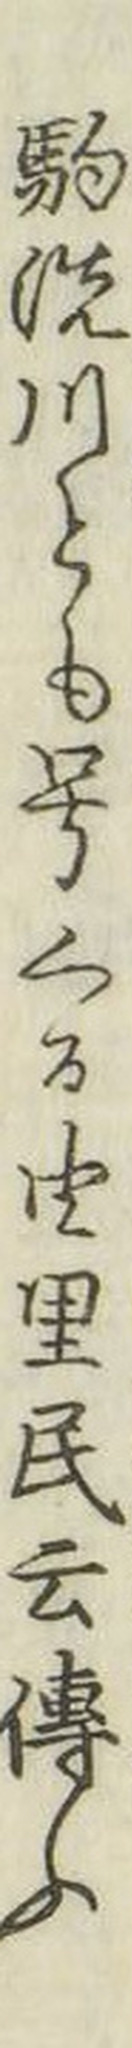駒洗川とも号くる由里民云伝ふ

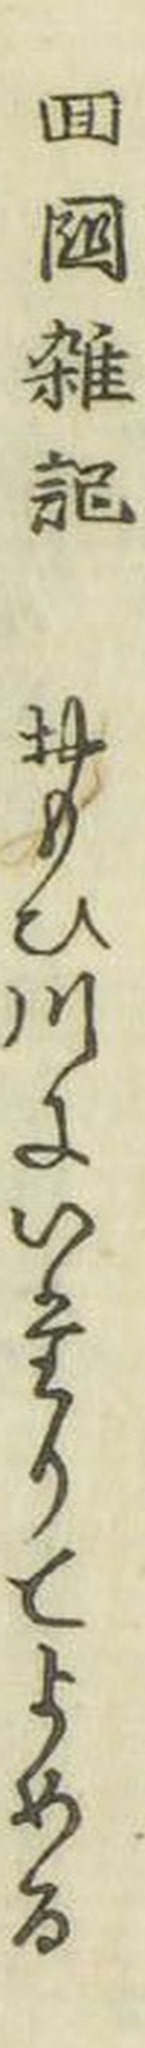回国雑記おもひ川にいたりてよめる
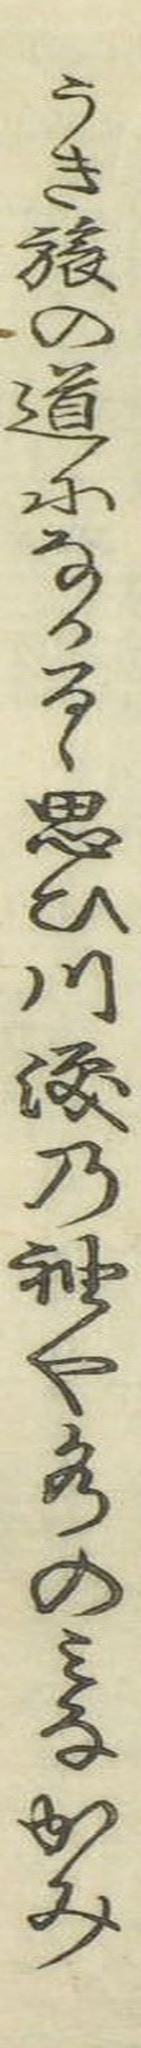うき旅の道になかるゝ思ひ川涙の袖や水のみなかみ道興准后
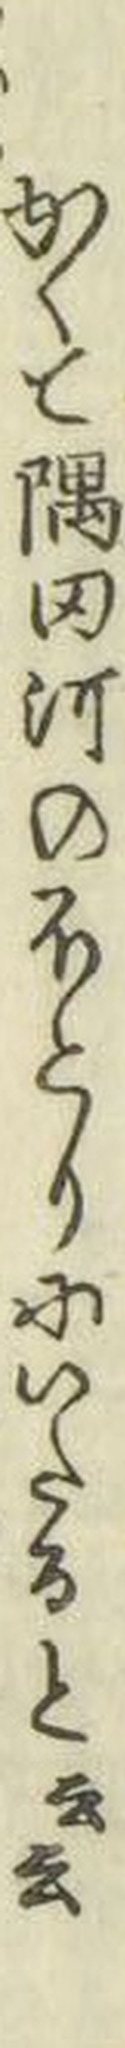かくて隅田河のほとりにいたると云云
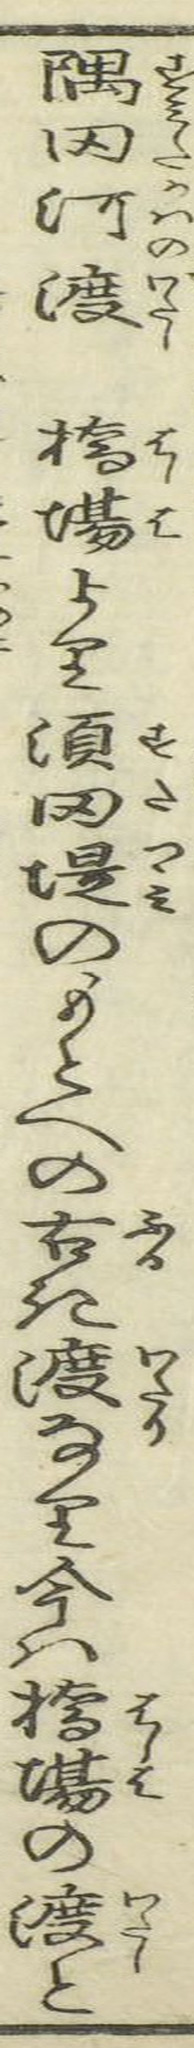隅田河渡橋場より須田堤のもとへの古き渡なり今は橋場の渡と
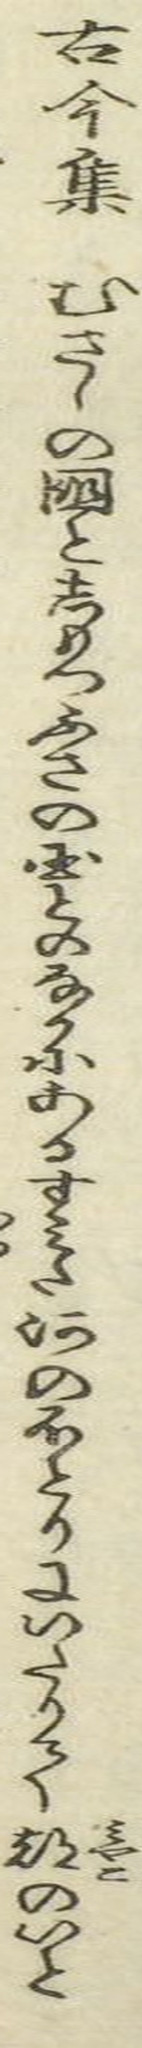古今集むさしの国としもつふさの国とのなかにあるすみた河のほとりにいたりて都のいと
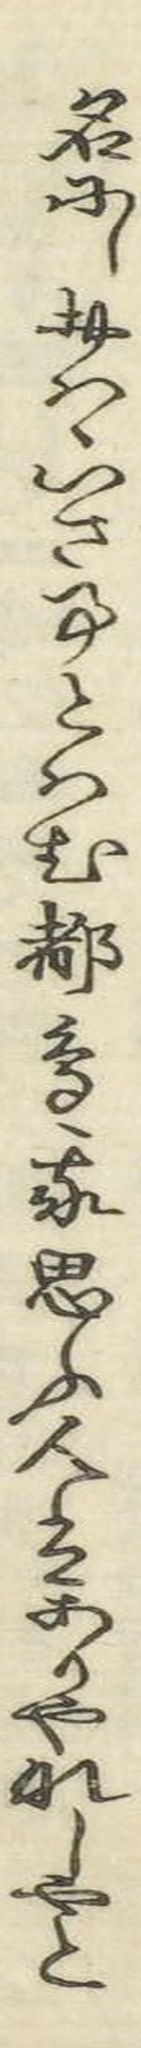名にしおはゝいさ事とはむ都鳥我思ふ人はありやなしやと
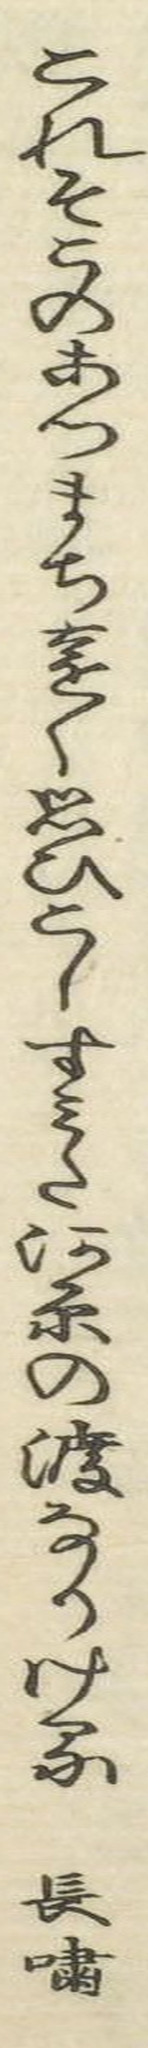これそこのあつまち遠く思ひこしすみた河原の渡なりける長嘯
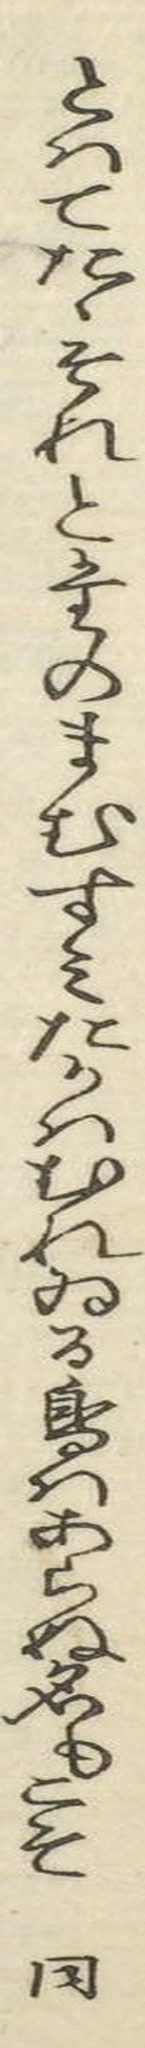とはてたゝそれとたのまむすみたかはむれゐる鳥はあらぬ名もこそ同
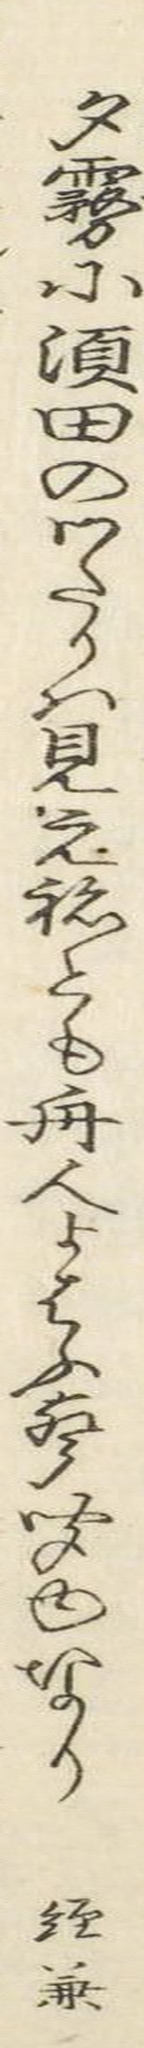夕霧に須田のわたりは見えねとも舟人よはふ声聞ゆなり経兼
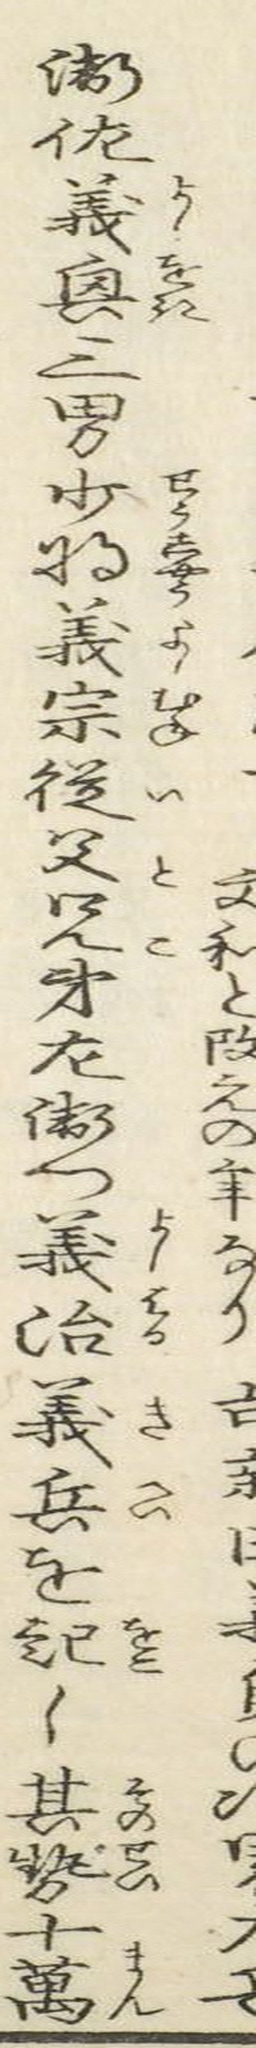衛佐義興三男少将義宗従父兄弟左衛門義治義兵を起し其勢十万
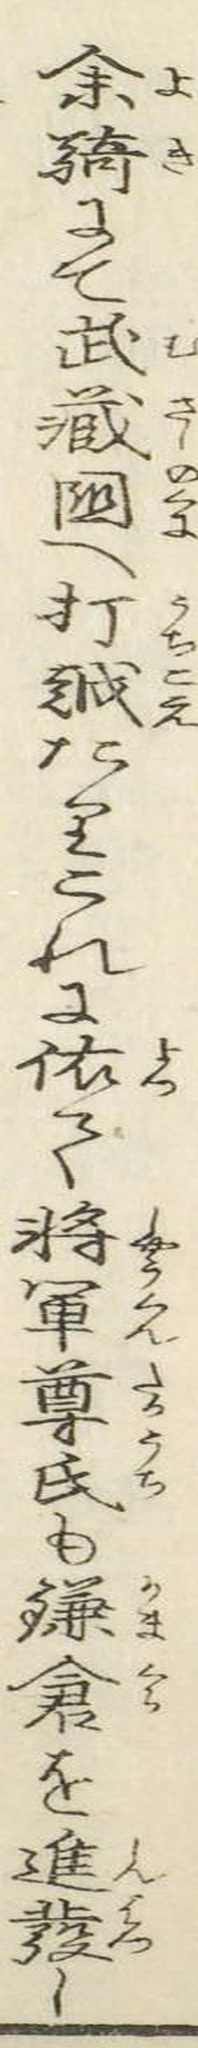余騎にて武蔵国へ打越たりこれに依て将軍尊氏も鎌倉を進発し
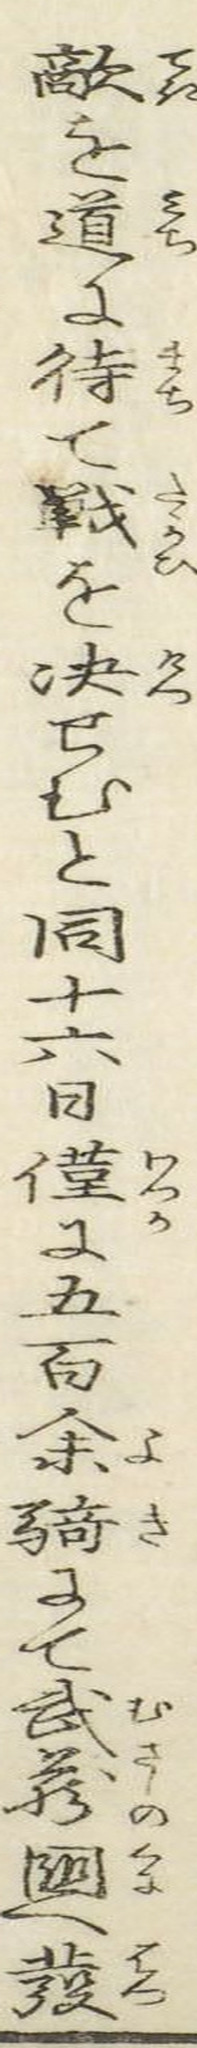敵を道に待て戦を決せむと同十六日僅に五百余騎にて武蔵国へ発
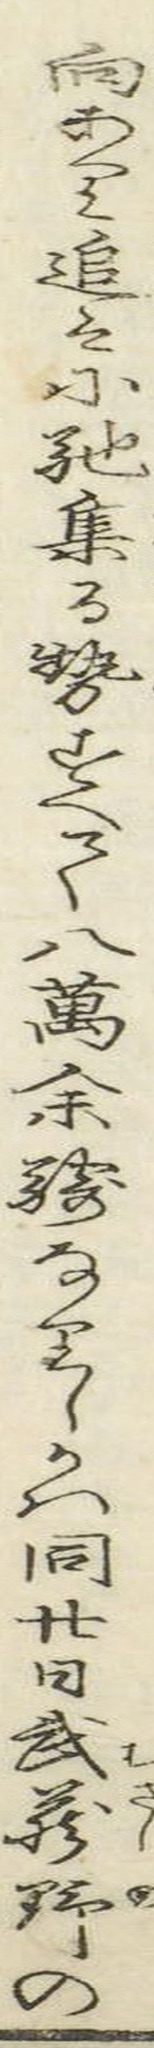向あり追々に馳集る勢すへて八万余騎なりしかは同廿日武蔵野の
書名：江戸名所図会 20巻 巻之17
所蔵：東京学芸大学教育コンテンツアーカイブ
